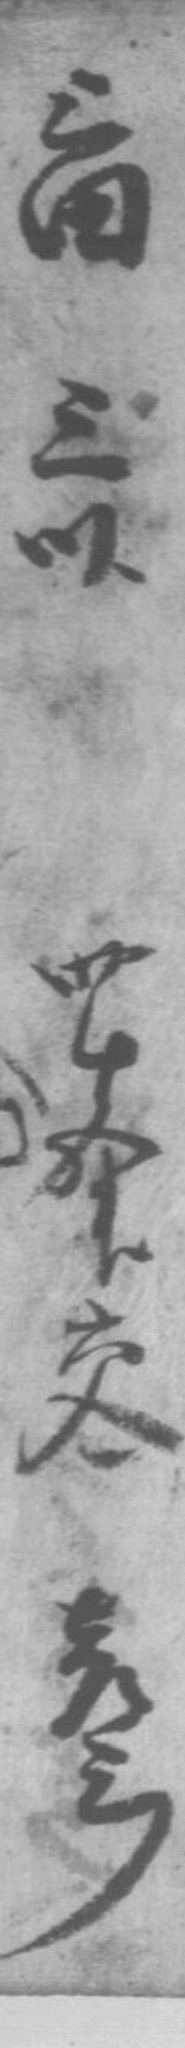上田三畝四斗八升六合彦三郎
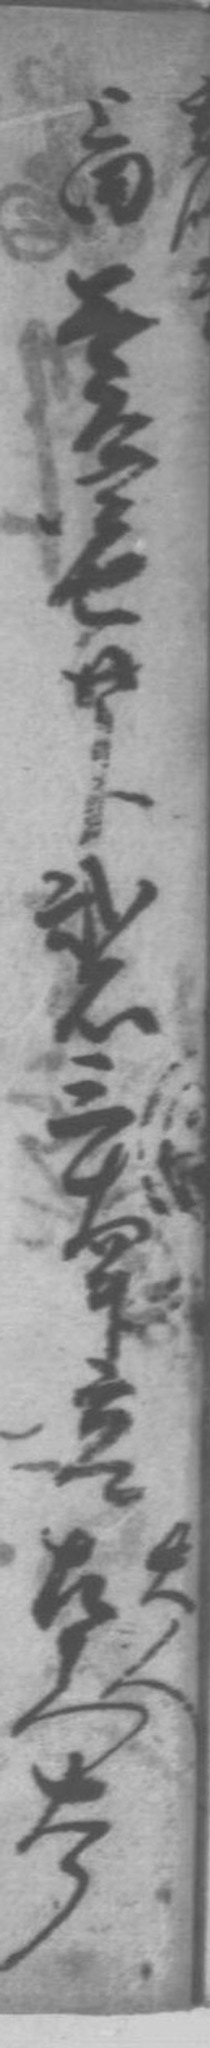上田壱反二せ廿分弐石三斗四升六合左衛門太郎
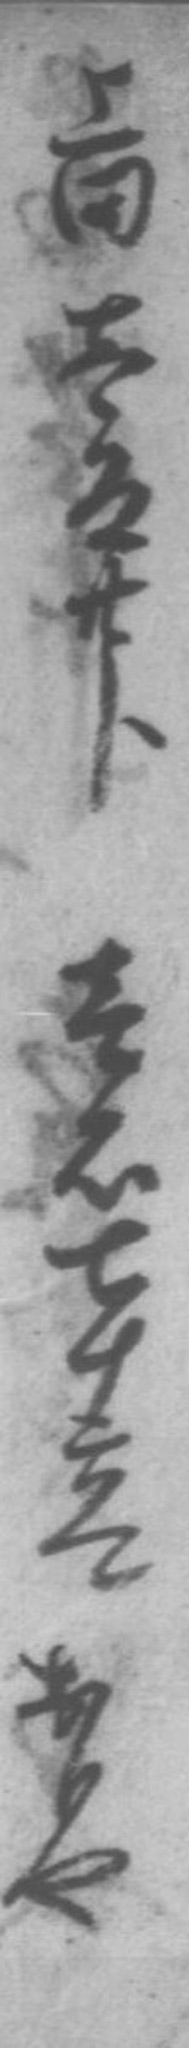上田壱反廿分壱石七斗六合おりや
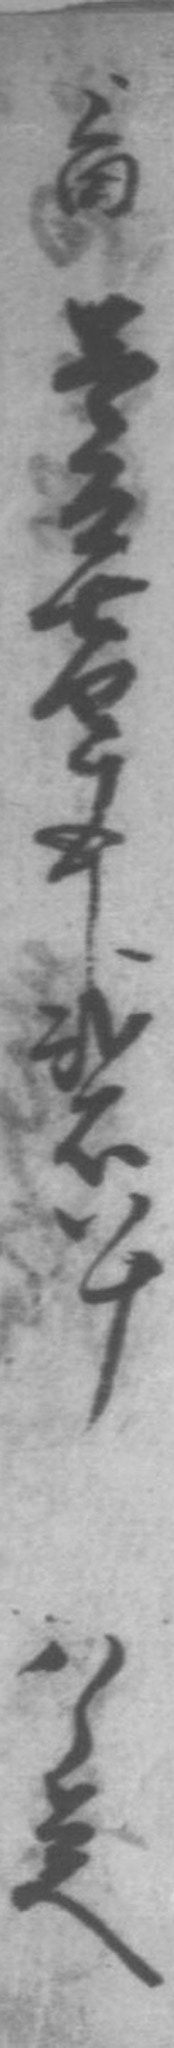上田壱反七せ十五分弐石八斗八郎兵衛

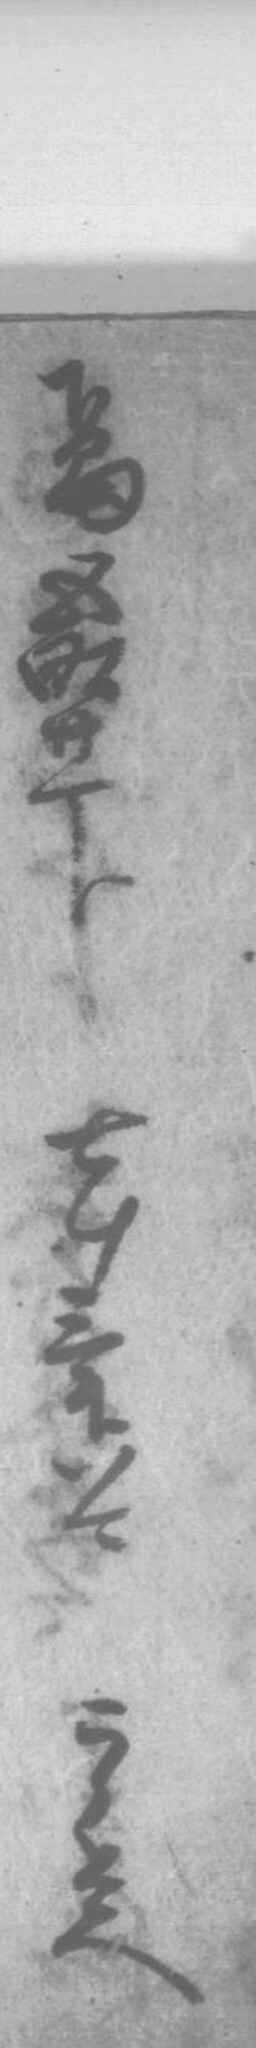下畠五畝廿一分七斗三升八合二郎兵衛
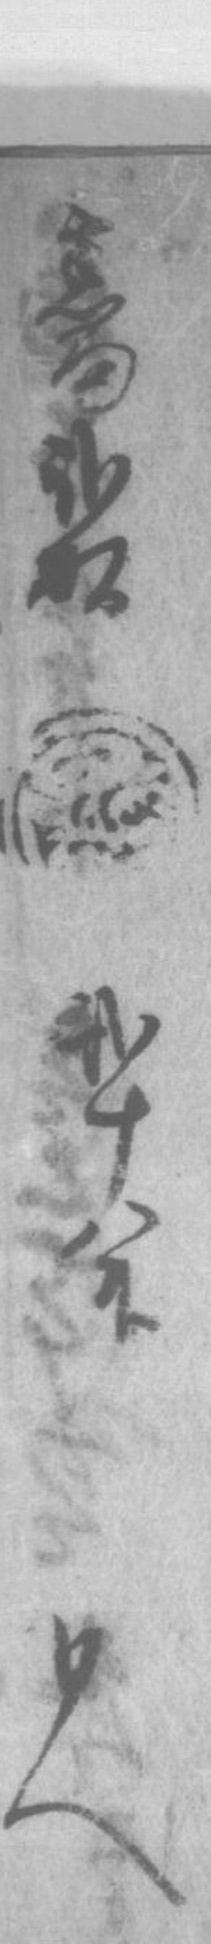荒田弐畝㊞弐斗八升同人

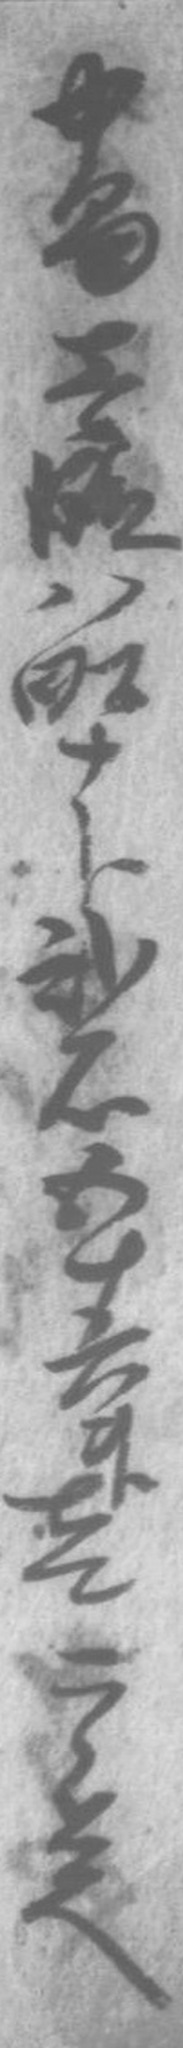中畠壱段八畝十分弐石五斗六升七合二郎兵衛
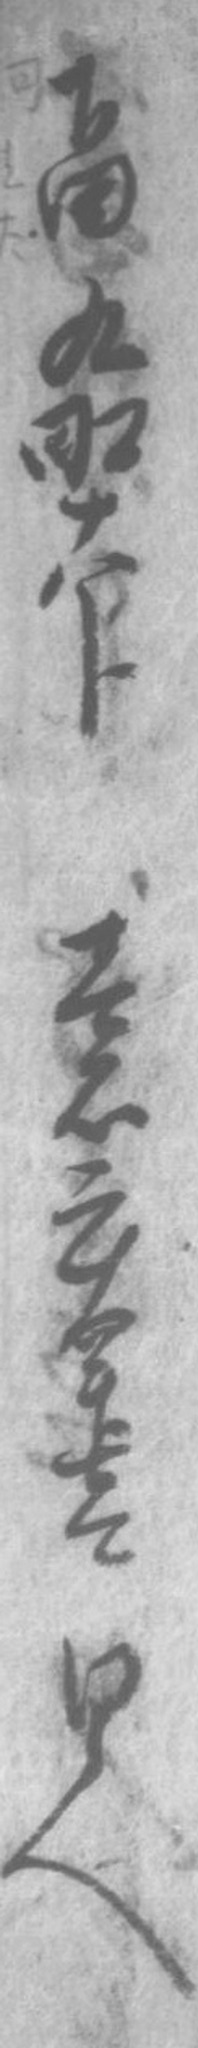下田九畝十八分壱石二斗四升七合同人
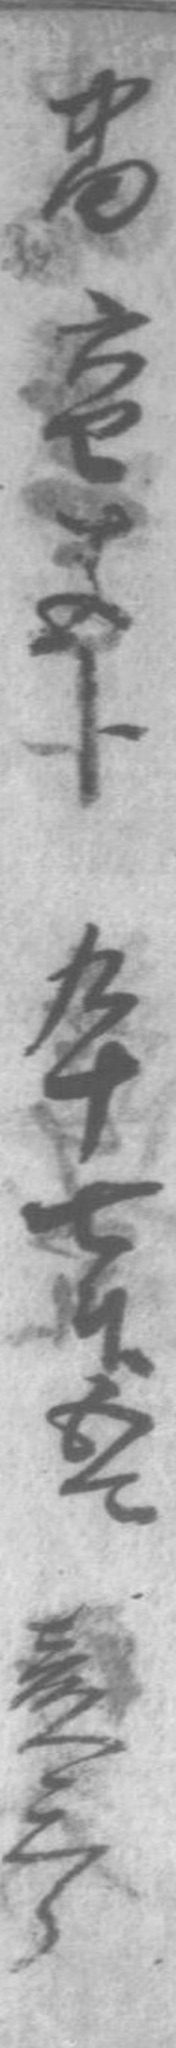中田六畝十五分九斗七升五合彦三郎
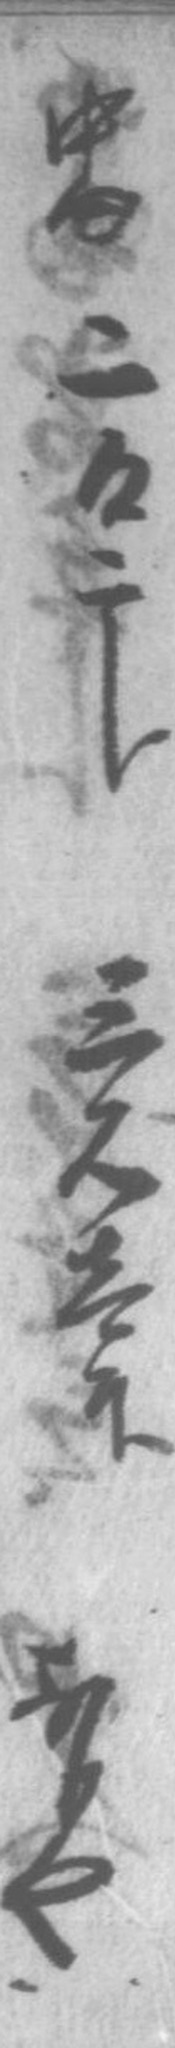中田二反二分三石壱升おりや
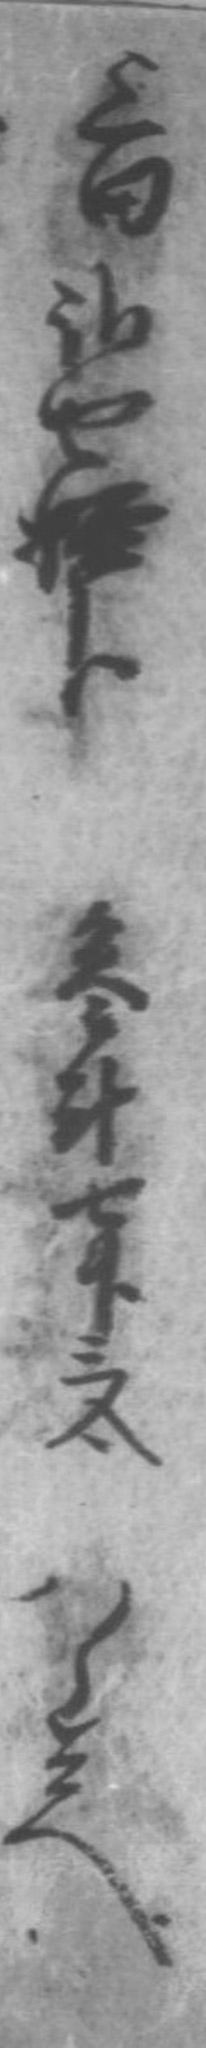上田弐せ拾分参斗七升三合八郎兵衛

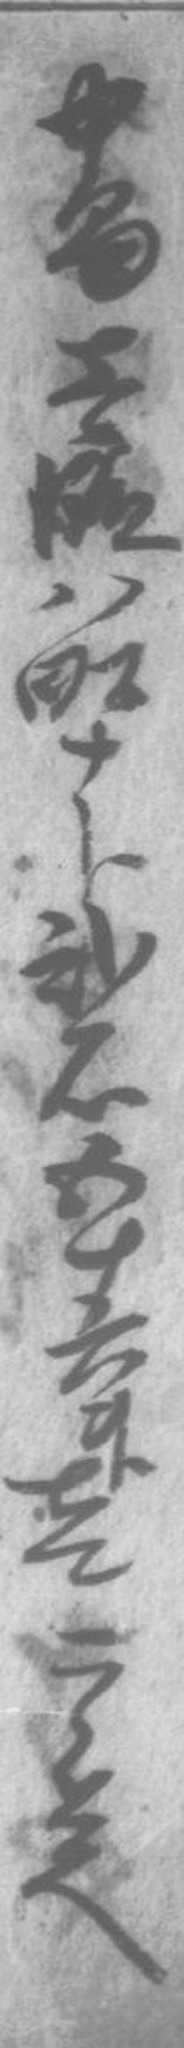中畠壱段八畝十分弐石五斗六升七合二郎兵衛
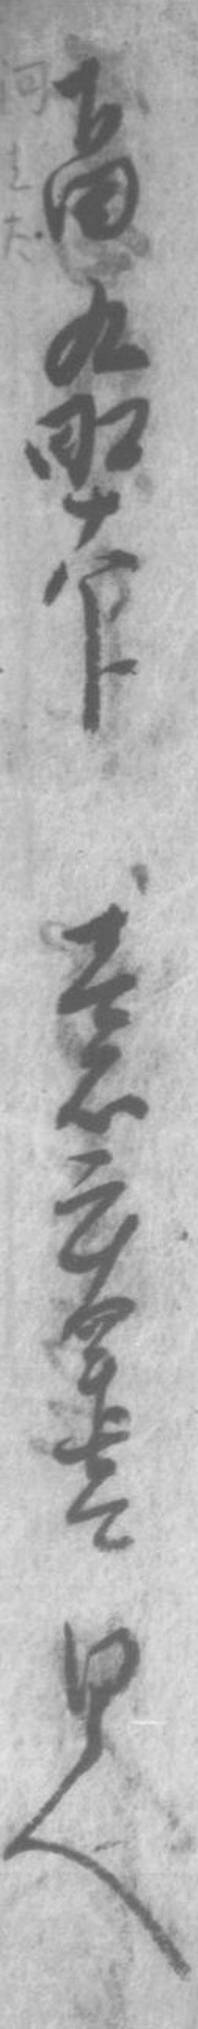下田九畝十八分壱石二斗四升七合同人
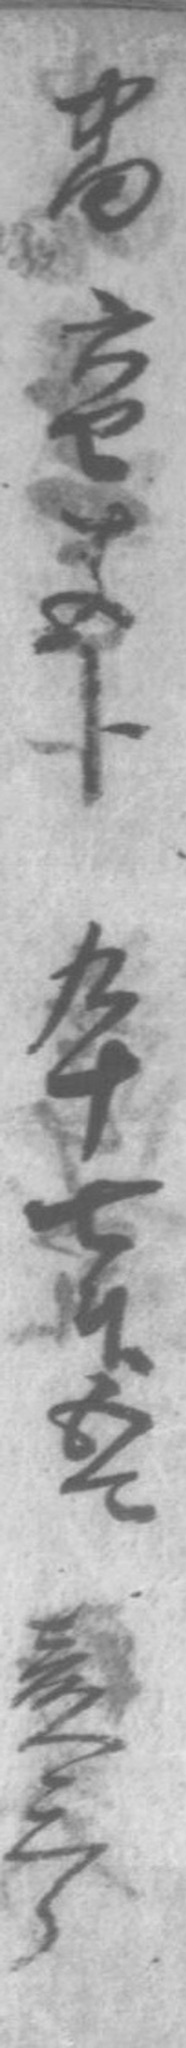中田六畝十五分九斗七升五合彦三郎
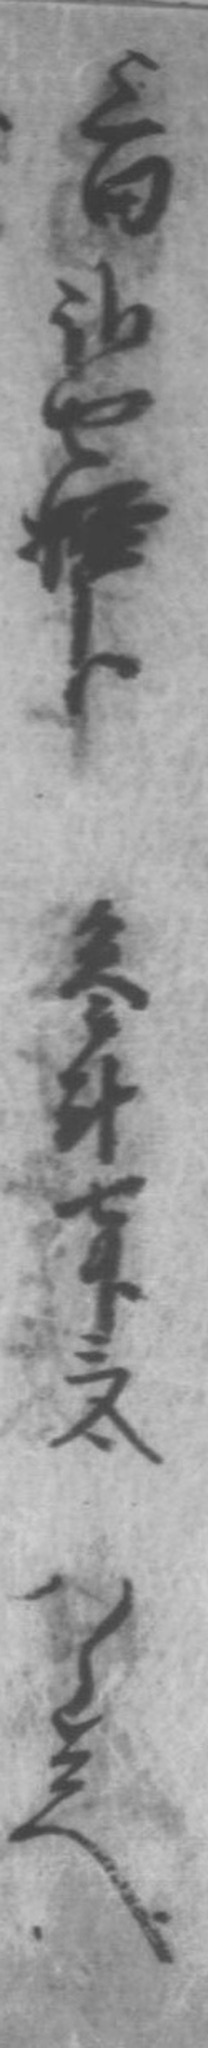上田弐せ拾分参斗七升三合八郎兵衛

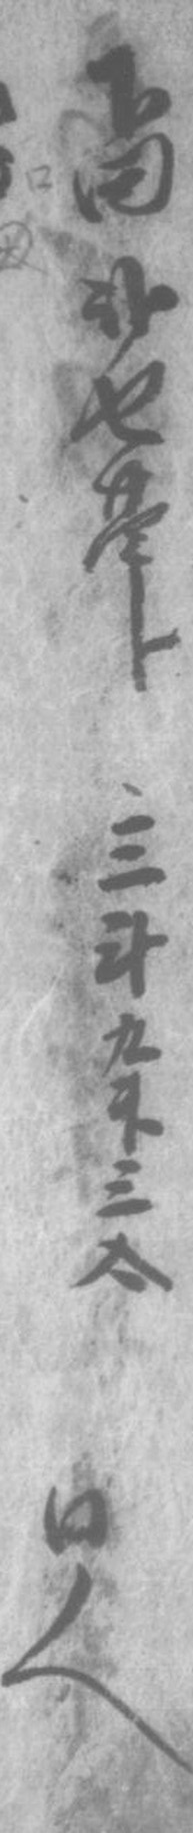下田弐せ廿四分三斗九升三合同人
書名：越州大野郡ノ内不動堂村御検地帳
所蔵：福井県文書館 Fukui Prefectural Archives
